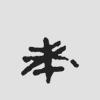未
